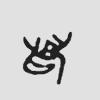舄
